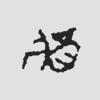將
